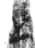之
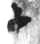十
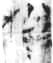檐（擔）
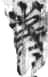○（巂）
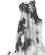五
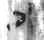又
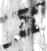五
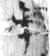來
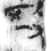敔
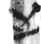之
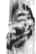檐（擔）
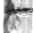一
